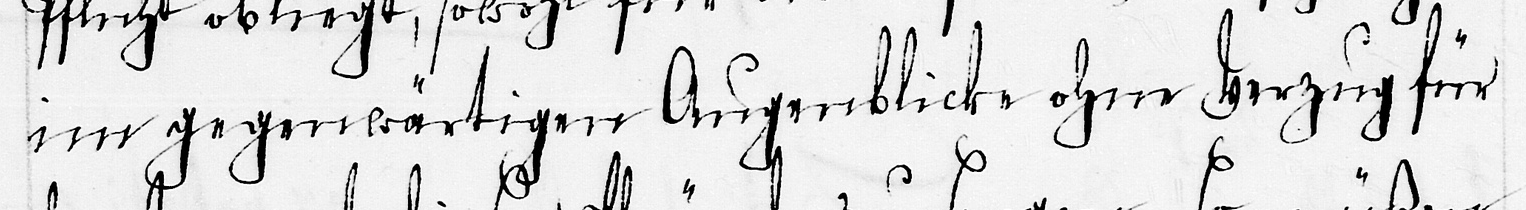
im gegenwärtigen Augenblicke ohne Verzug für
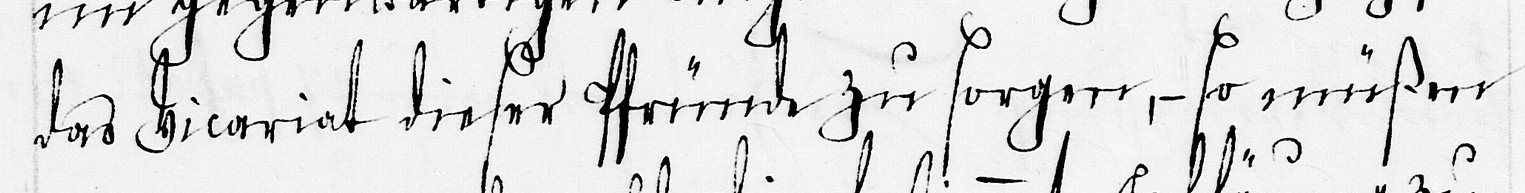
das Vicariat dieser Pfründe zu sorgen, – so müßen
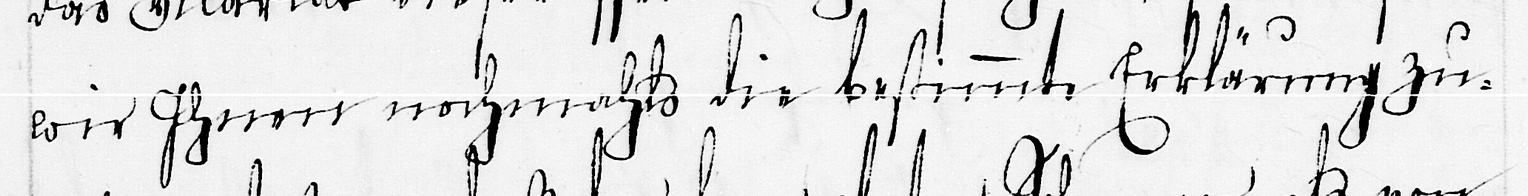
wir Ihnen nochmahls die bestimmte Erklärung zu¬
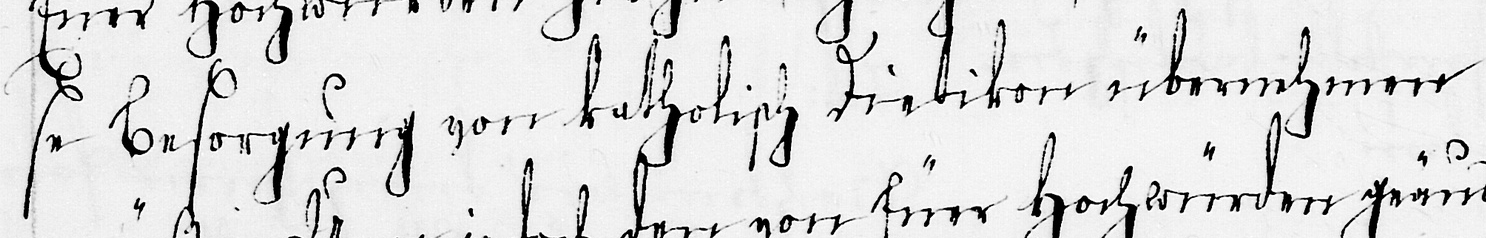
se Besorgung von katholisch Dietikon übernehmen
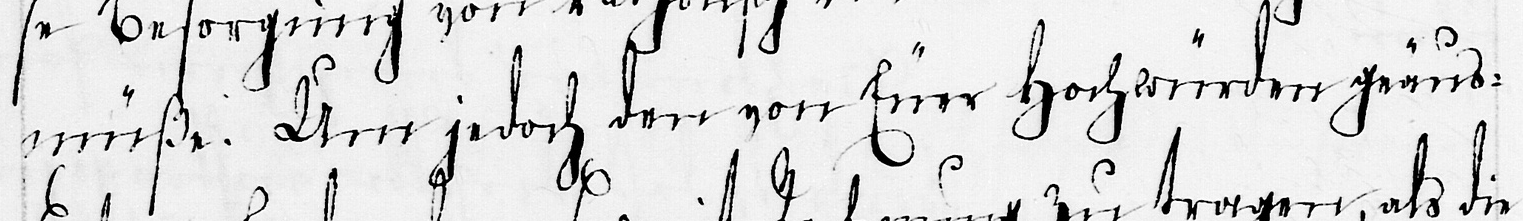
müße. Um jedoch den von Euer Hochwürden geäuß¬
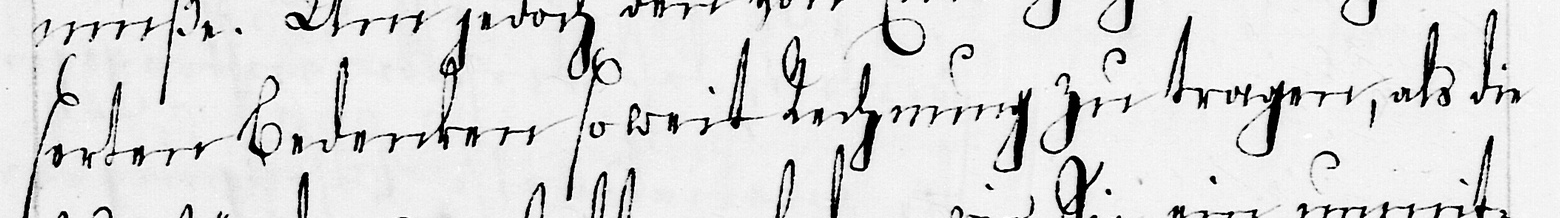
erten Bedenken soweit Rechnung zu tragen, als die
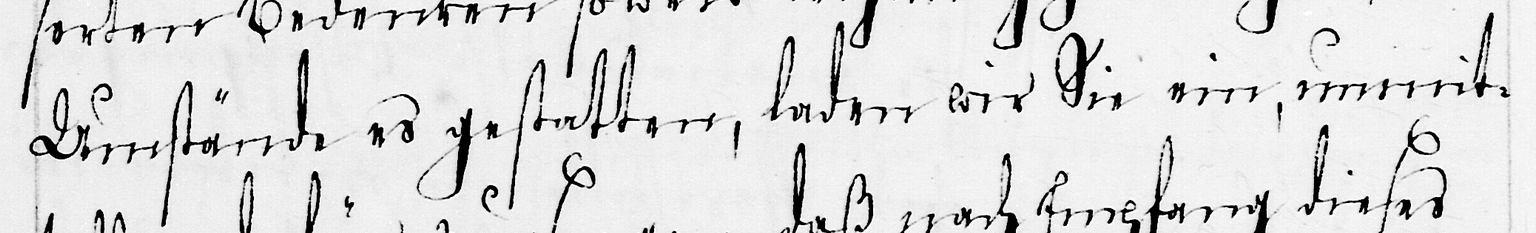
Umstände es gestatten, laden wir Sie ein, unmit¬
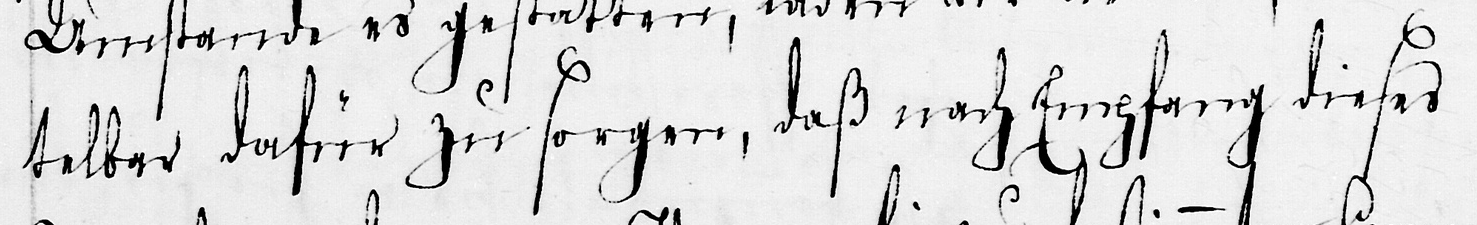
telbar dafür zu sorgen, daß nach Empfang dieses
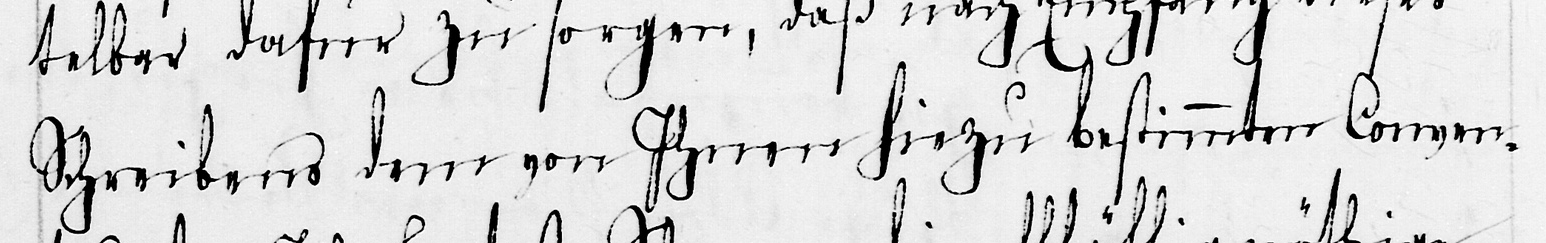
Schreibens dem von Ihnen hiezu bestimmten Conven¬
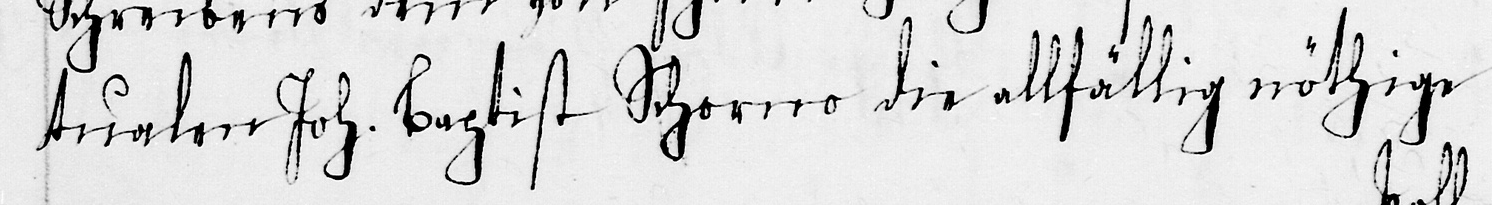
tualen Joh. Baptist Schorno die allfällig nöthige
